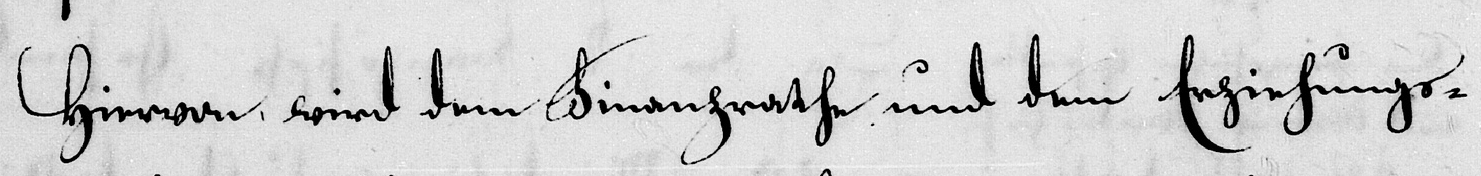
Hievon wird dem Finanzrathe und dem Erziehungs¬
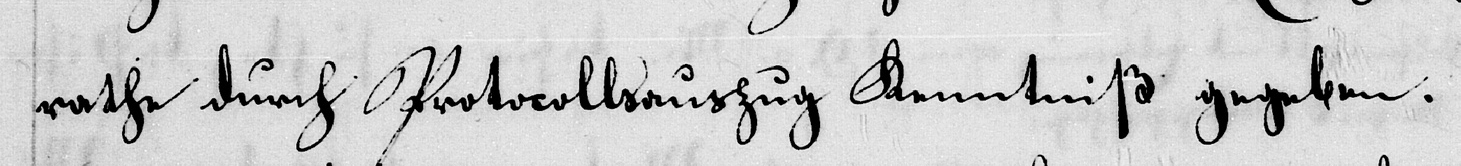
rathe durch Protocollsauszug Kenntniß gegeben.
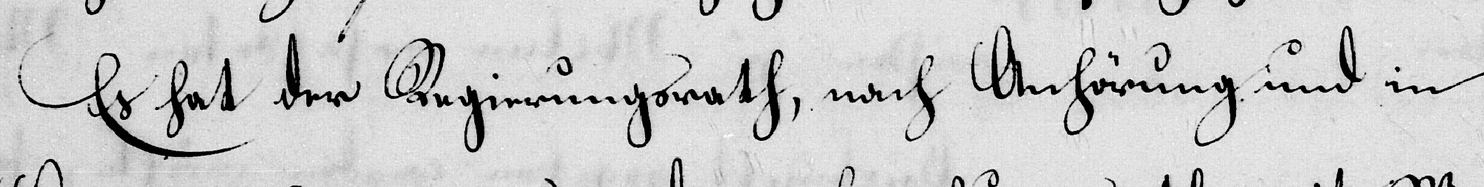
Es hat der Regierungsrath, nach Anhörung und in
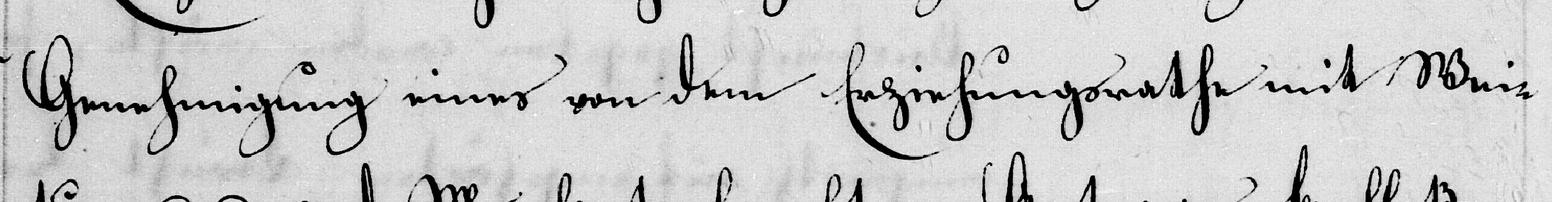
Genehmigung eines von dem Bezirksrathe mit Wei¬
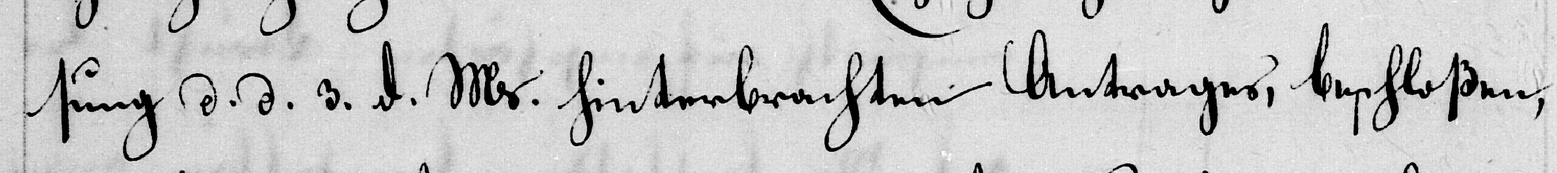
sung d. d. 3. d. Ms. hinterbrachten Antrages, beschloßen,
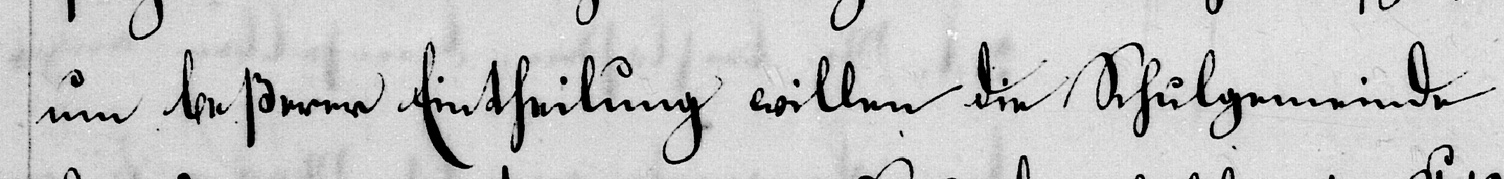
um beßerer Eintheilung willen die Schulgemeinde
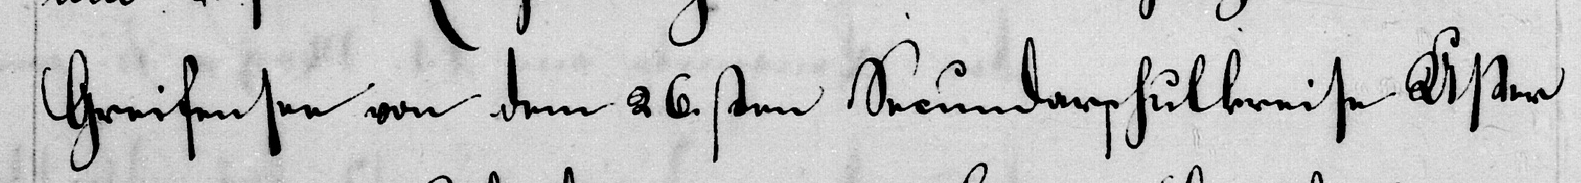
Greifensee von dem 26.sten Secundarschulkreise Uster
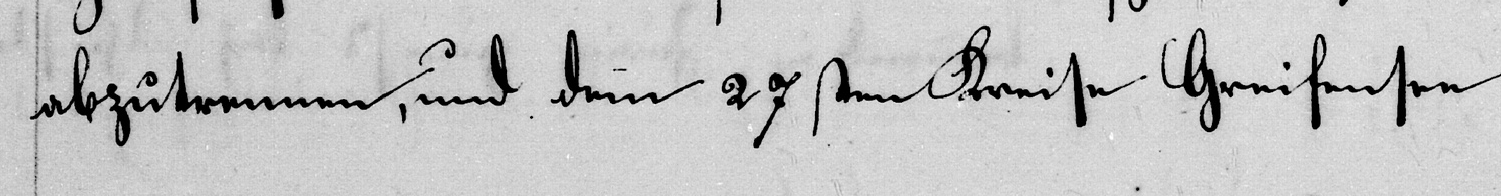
abzutrennen, und dem 27sten Kreise Greifensee
